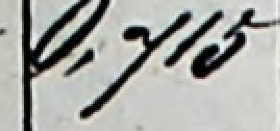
0,715
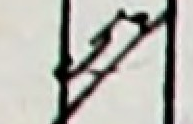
57
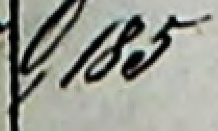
0,185
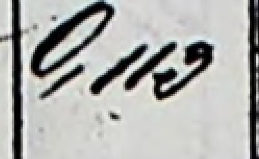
0,113
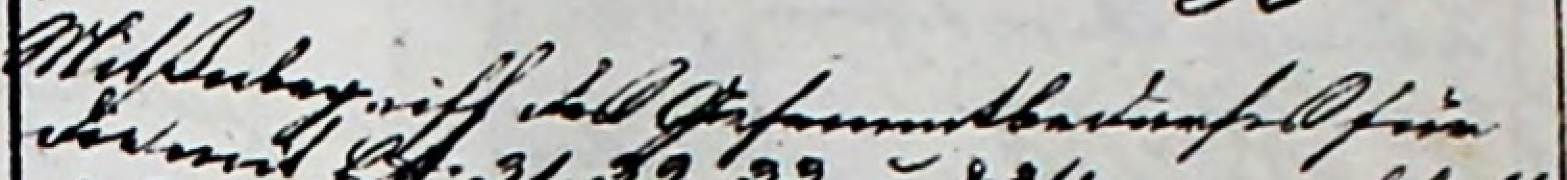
Mit Inbegriff des Gesamtbedarfes für
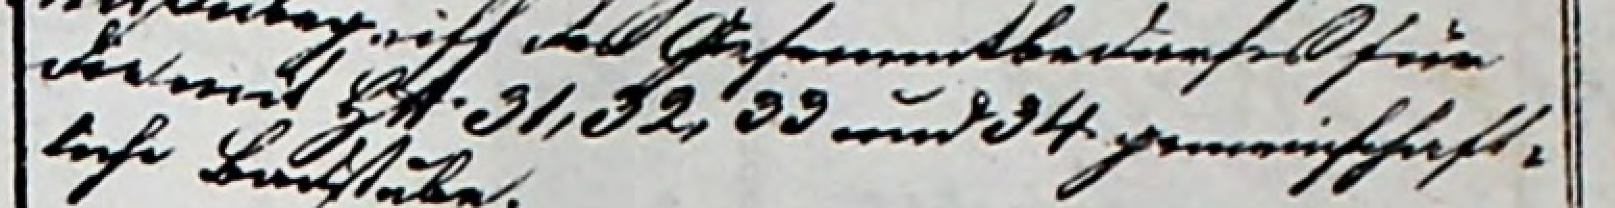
die mit H? 31, 32, 33 und 34 gemeinschaft„
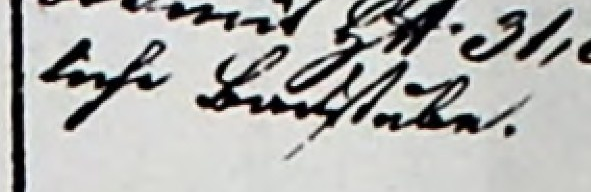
liche Badstube.
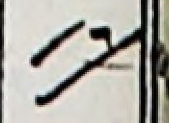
17
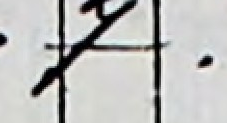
7
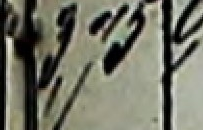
3,75
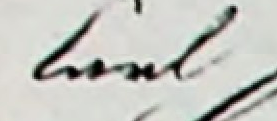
Carl
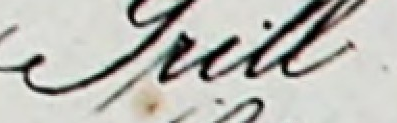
Grill
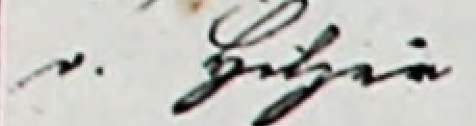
v. Hitzer
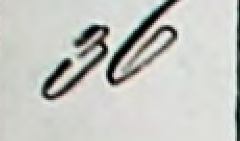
36
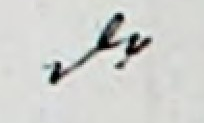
do
